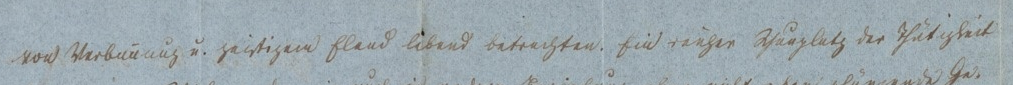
von Verbannung u. geistigem Elend lebend betrachten. Ein rauher Schauplatz der Thätigkeit
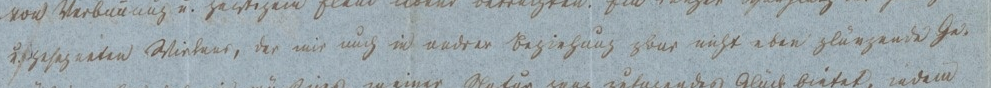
u. gesegneten Wirkens, der mir auch in andrer Beziehung zwar nicht eben glänzende Ge-
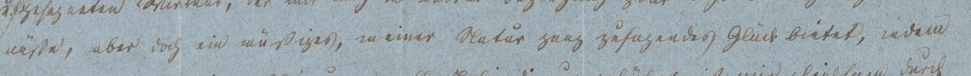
nüsse, aber doch ein mäßiges, meiner Natur ganz zusagendes Glück bietet, indem
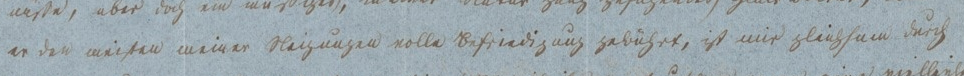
er den meisten meiner Neigungen volle Befriedigung gewährt, ist mir gleichsam durch
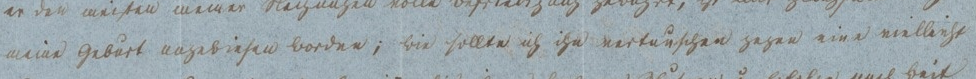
meine Geburt angewiesen worden; wie sollte ich ihn vertauschen gegen eine vielleicht
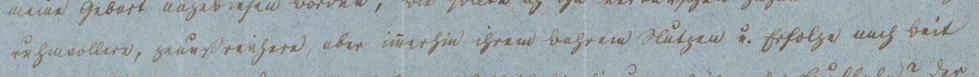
ruhmvollere, genußreichere, aber immerhin ihrem wahren Nutzen u. Erfolge auch weit
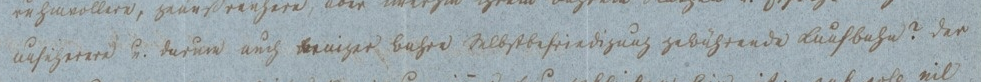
unsicherere u. darum auch weniger wahre Selbstbefriedigung gewährende Laufbahn? Der
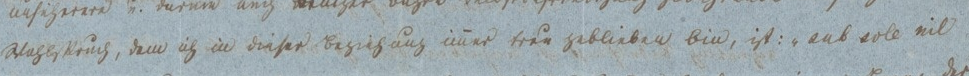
Wahlspruch, dem ich in dieser Beziehung immer treu geblieben bin, ist: «sub sole nil
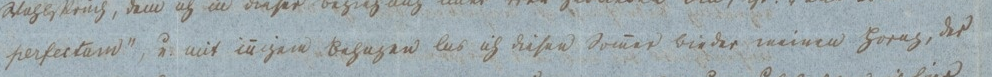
perfectum», u. mit innigem Behagen las ich diesen Sommer wieder meinen Horaz, der
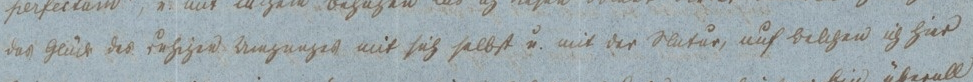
das Glück des ruhigen Umganges mit sich selbst u. mit der Natur, auf welchen ich hier
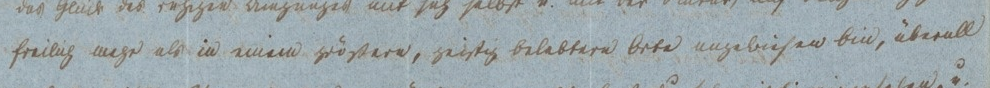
freilich mehr als in einem größern, geistig belebtern Orte angewiesen bin, überall
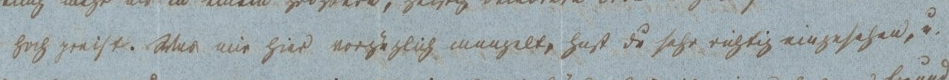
hoch preist. Was mir hier vorzüglich mangelt, hast du sehr richtig eingesehen, u.
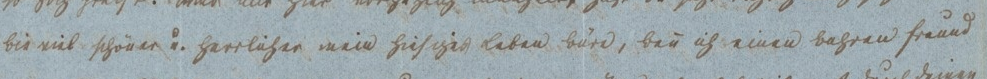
wie viel schöner u. herrlicher mein hiesiges Leben wäre, wenn ich einen wahren Freund
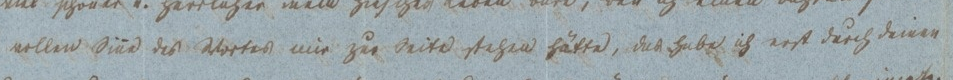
vollen Sinne des Wortes mir zur Seite stehen hätte, das habe ich erst durch deinen
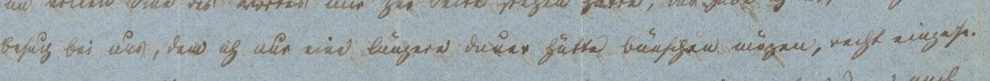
Besuch bei uns, dem ich nur eine längere Dauer hätte wünschen mögen, recht eingese-
